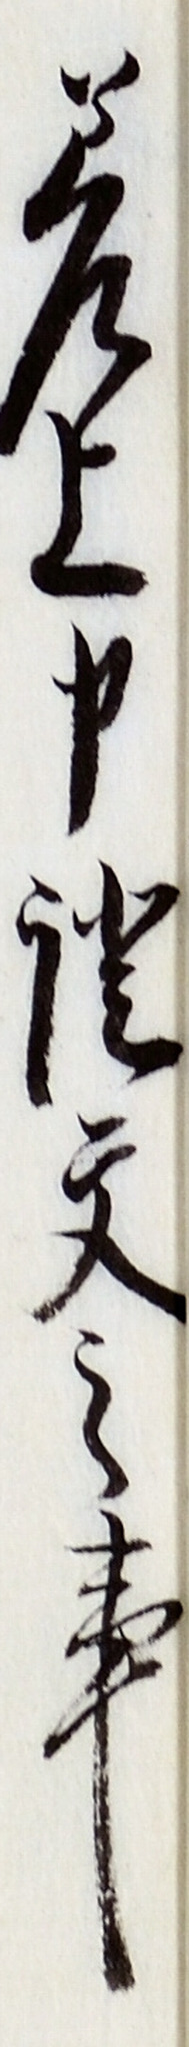差上申証文之事
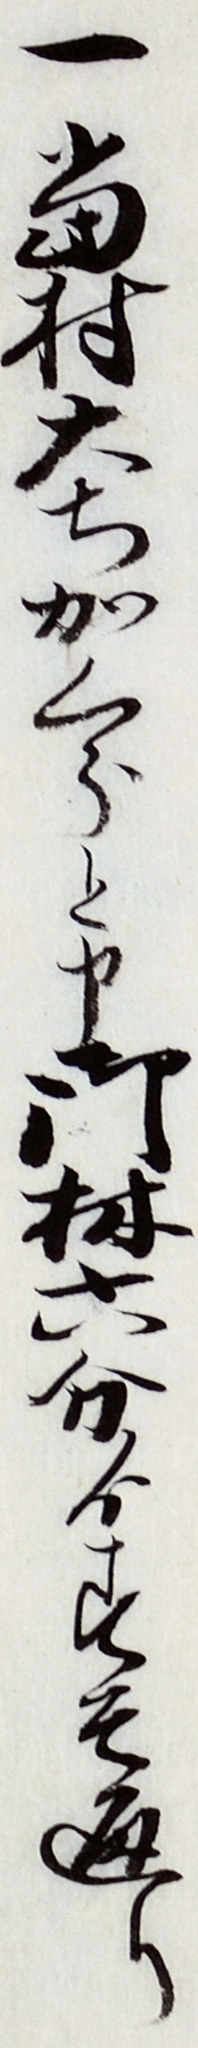一当村大ちかくらと申御林六分ゟすそ通り
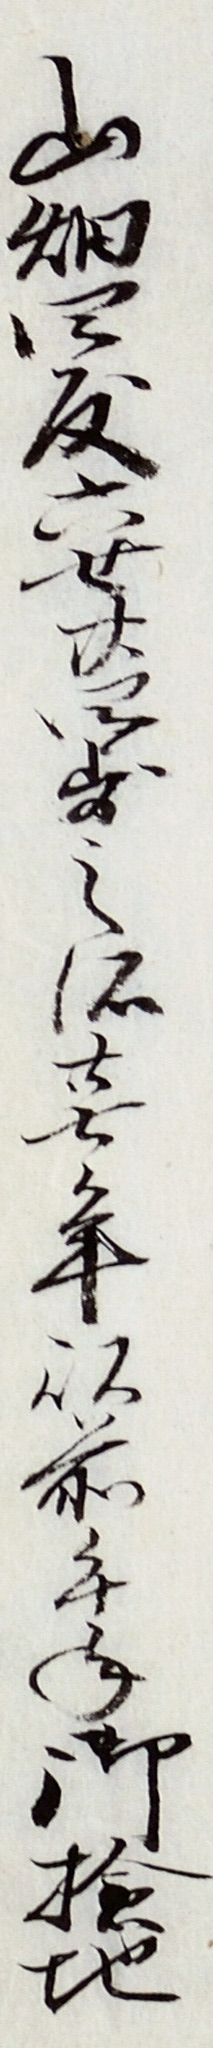山畑四反六せ廿四歩之所共七ヶ年以前午年御検地
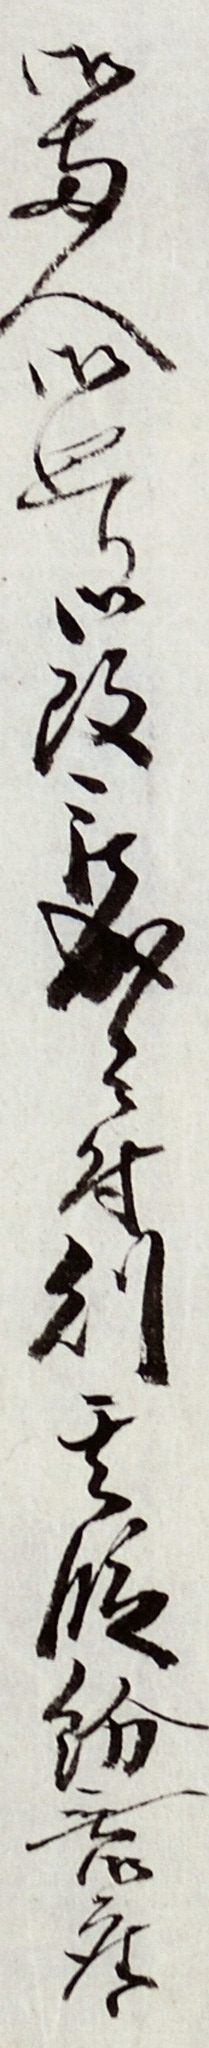御両人御廻り御改被成候ニ付則其段無御座候
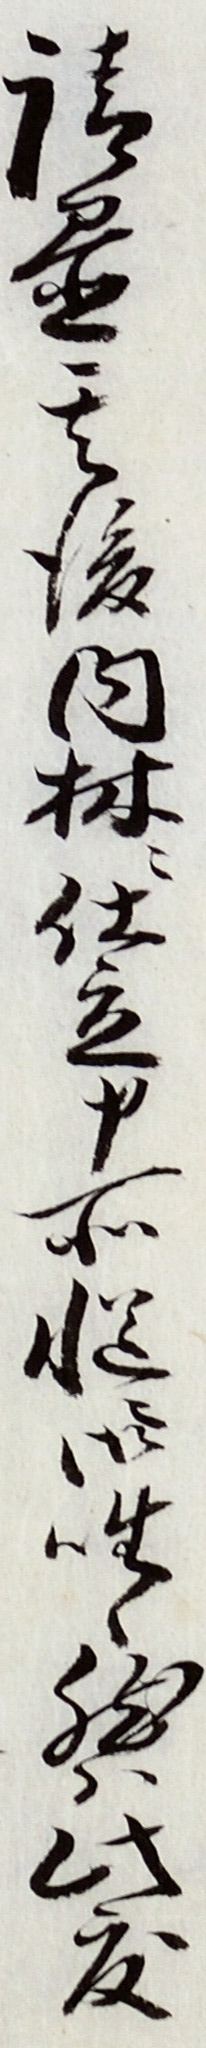請置其後内林ニ仕立申所慥ニ御座候然ハ此度
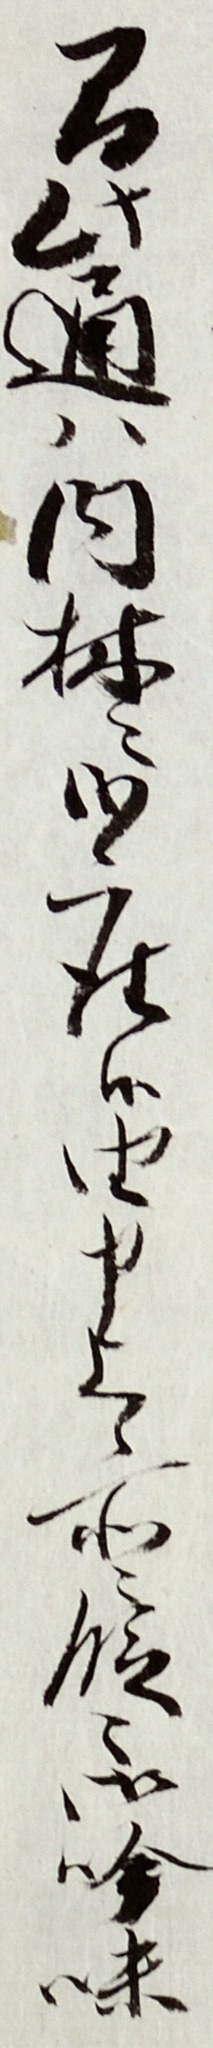間此通ハ内林ニ御座候由申上候所々段々御吟味
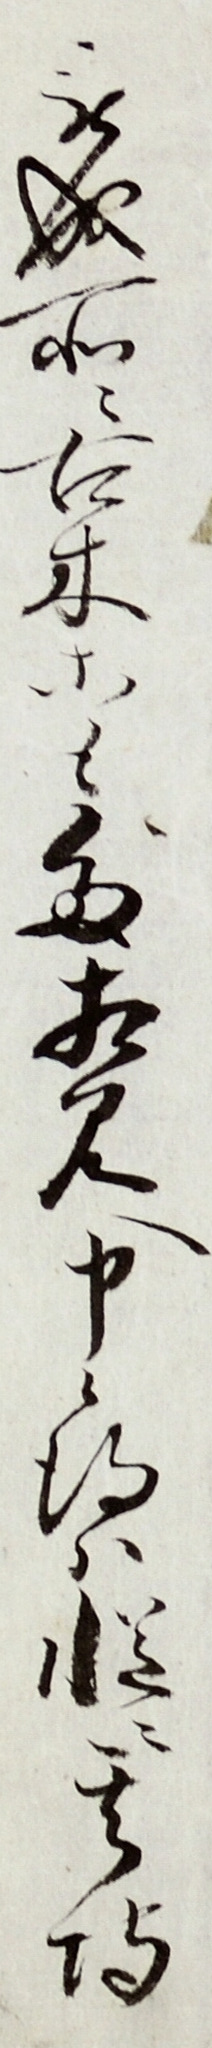被成所ニ古木等も多相見へ申候得ハ慥ニ其埒
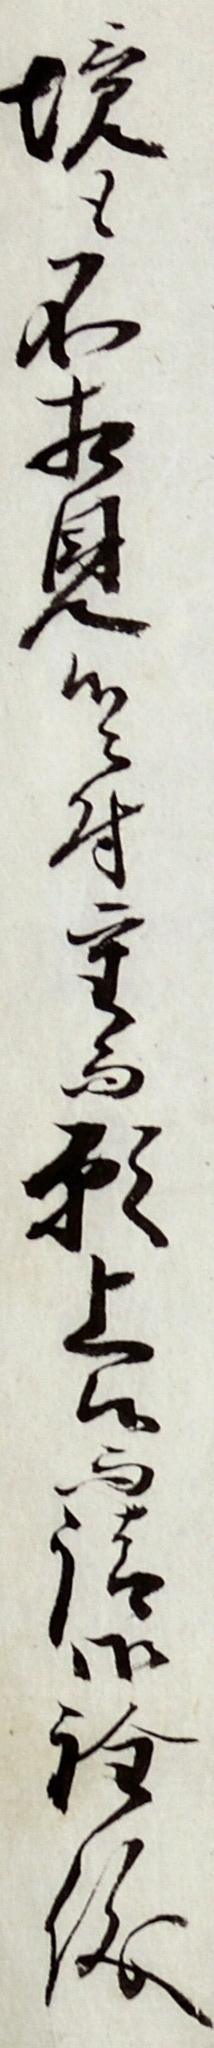境も不相見候ニ付重而願上候而請御詮儀

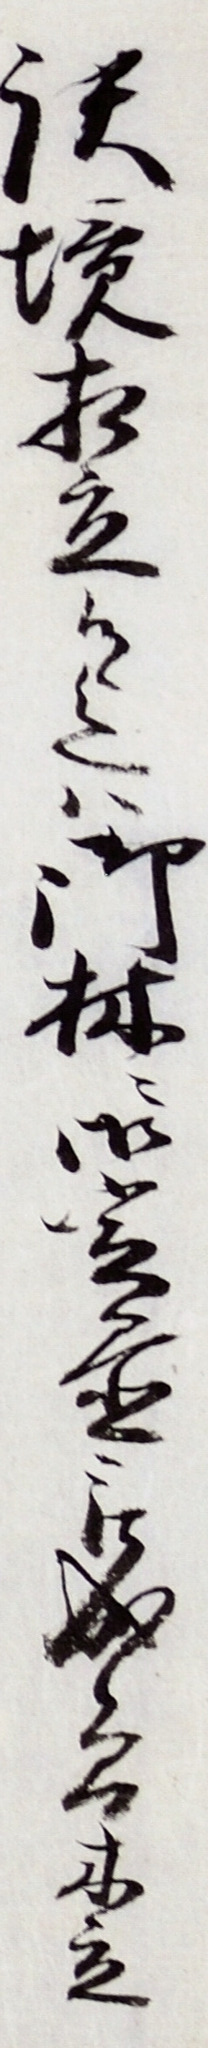訳境相立候迄ハ御林ニ御定置被成候間木立
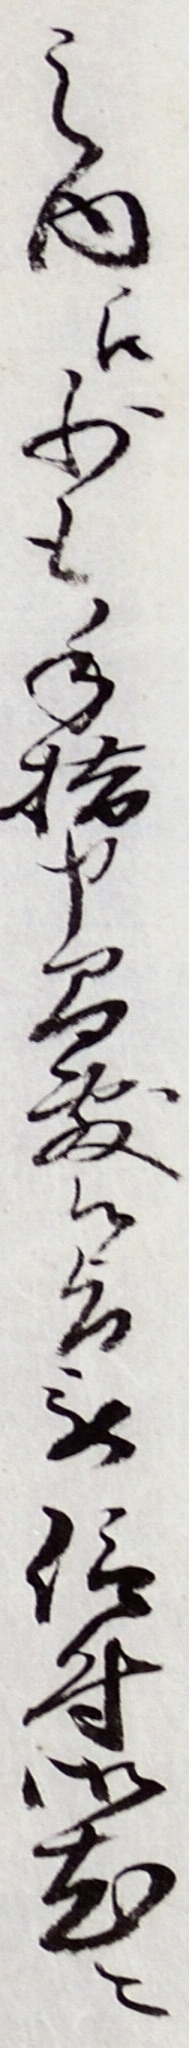之内江少も手指申間敷候旨被仰付御尤ニ
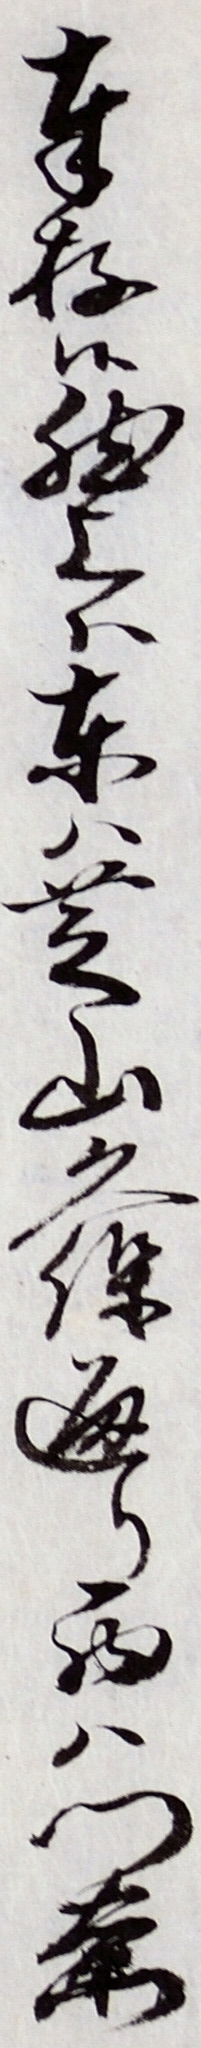奉存候然上ハ東ハ芝山久保通り西ハ門右衛門
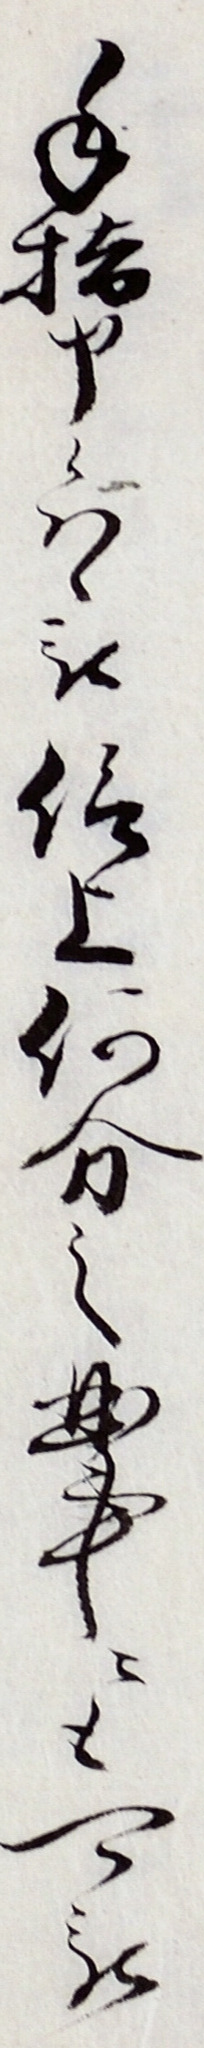手指申候ハヽ被仰上何分之曲事ニも可被
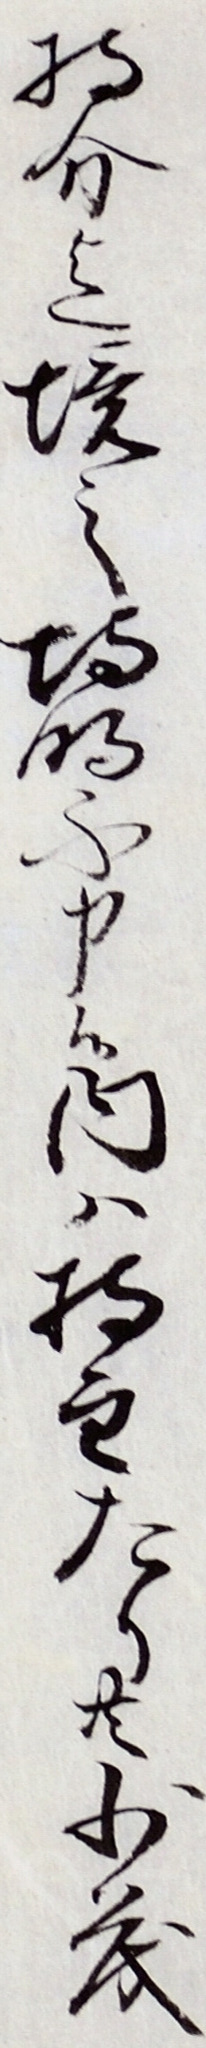持分迄境之埒明不申候内ハ持主たり共少茂
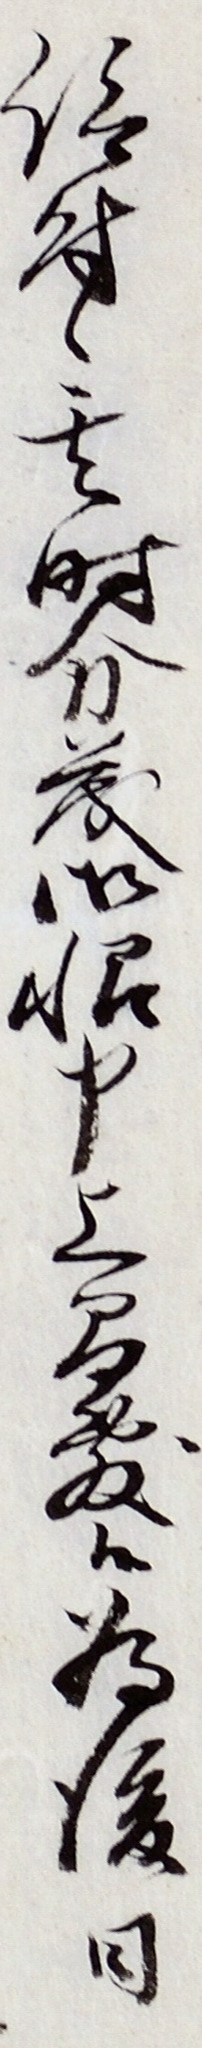仰付候其時分茂御恨申上間敷候為後日
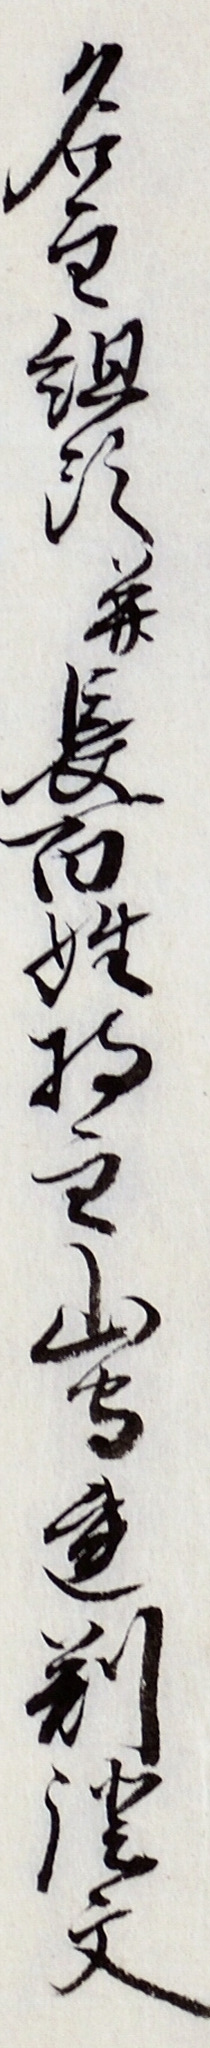名主組頭并長百姓持主山守連判証文
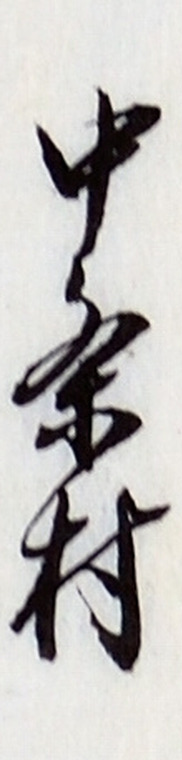中条村
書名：御林御竹藪証文控
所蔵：伊那市立高遠町図書館・合同会社AMANE
